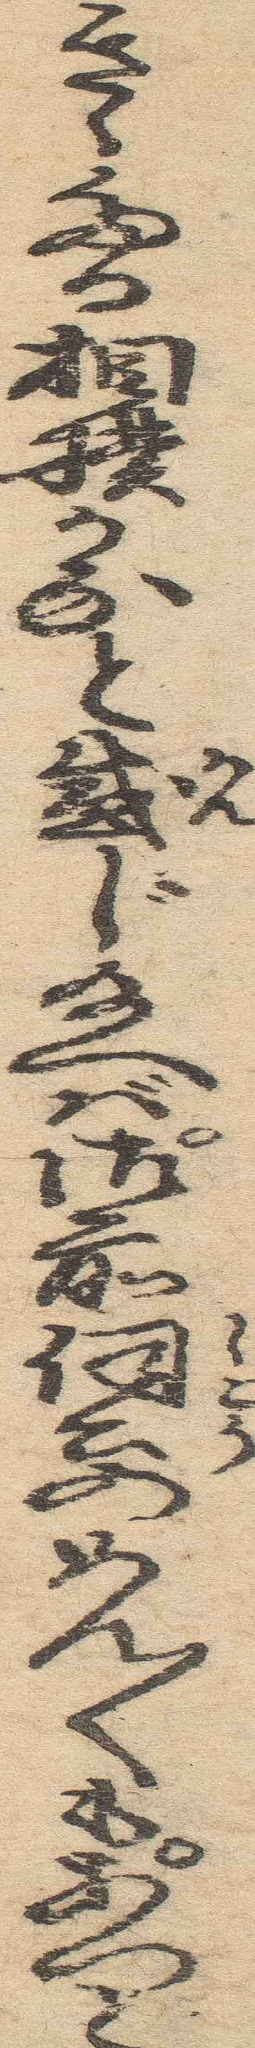きゝたる相撲かなと感じ給へば。御前伺公のめん〳〵もあつと
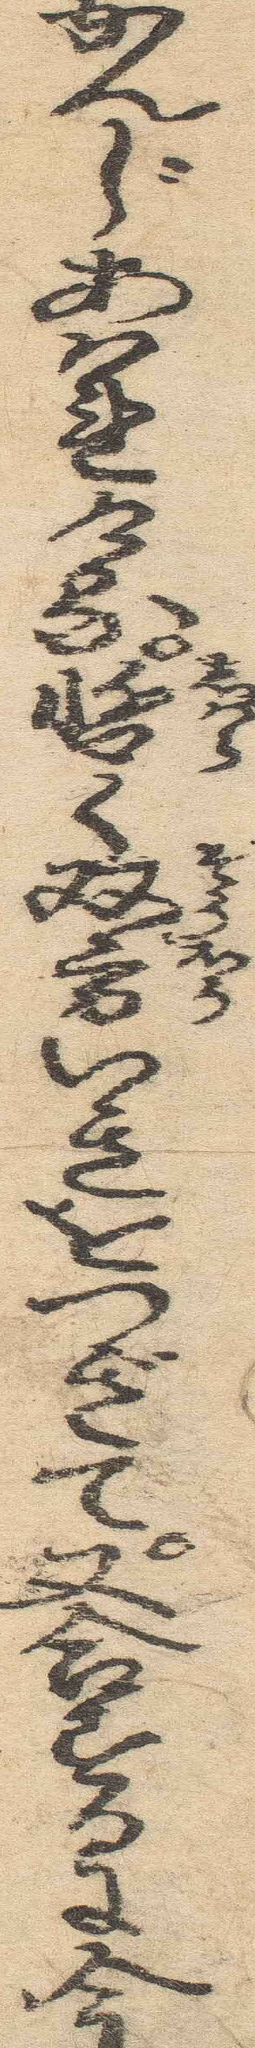かんじあはれける。暫く双方いきをつぎて。又合するに今
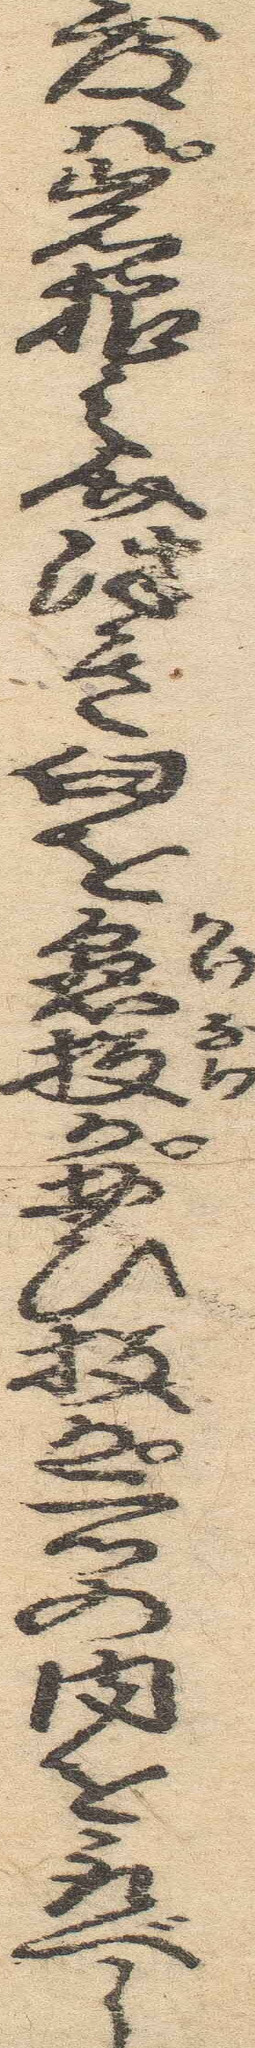度は岩根之介つき臼を懸投る。おひ投る。二つの内を取べし
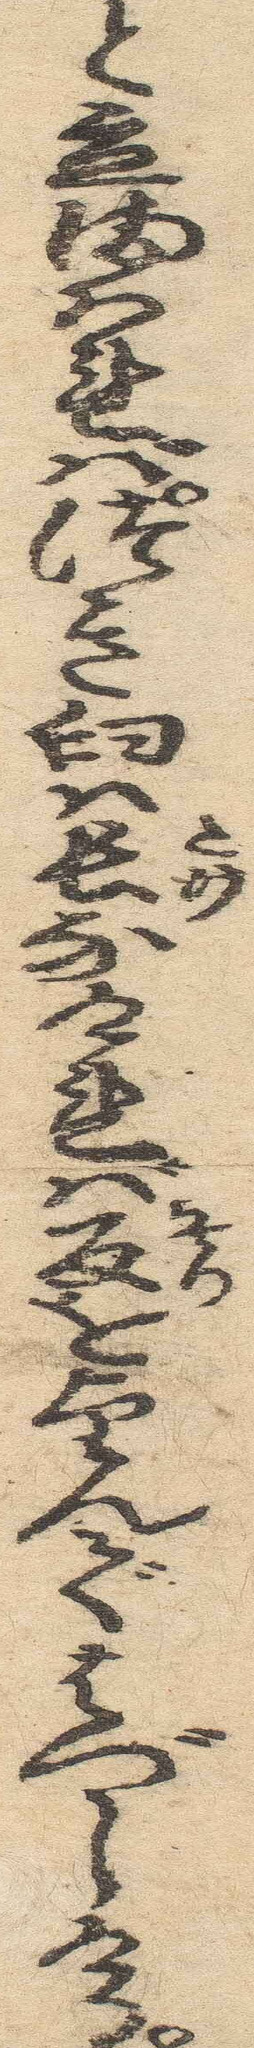と立まはれば。つき臼は長なければ反を望んではづしける。
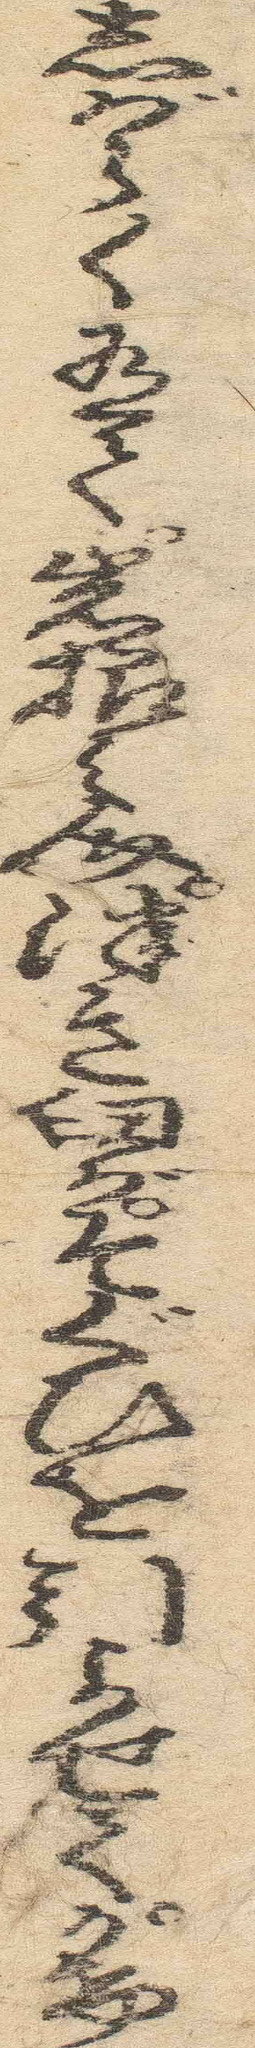しばらく有て。岩根之介。つき臼がそぐひを引よせて。かけ
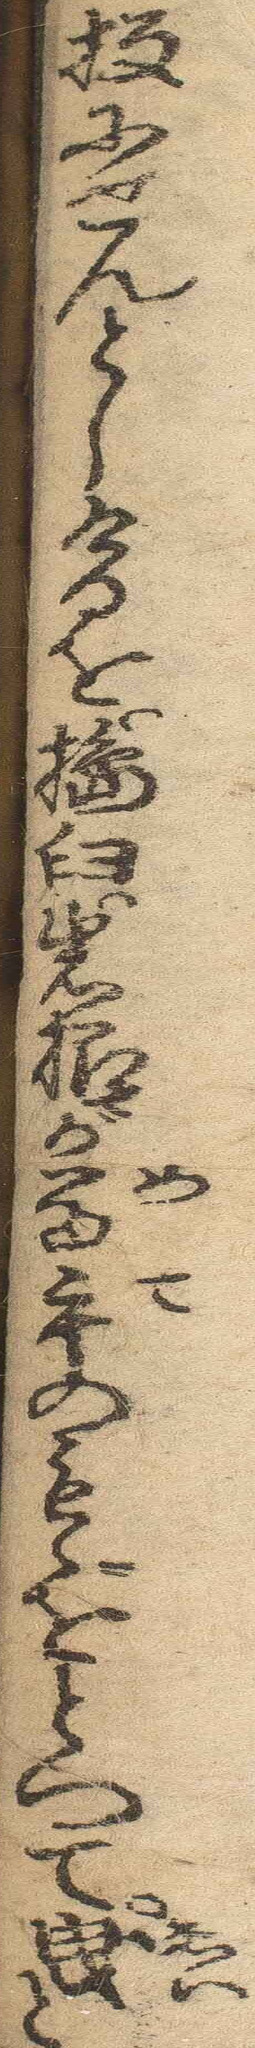投にせんとしけるを搗臼。岩根が馬手のもとをとつて。曳と
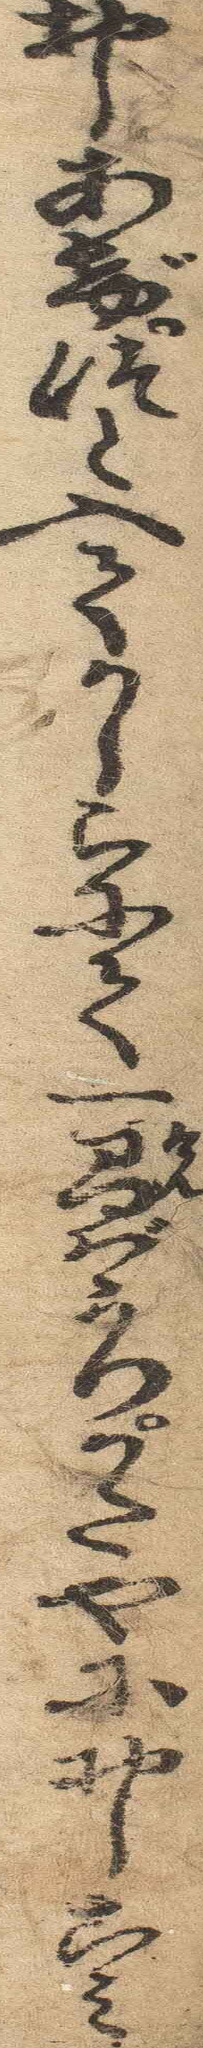おしあげ。つと入てかしらにて一間ばかり。かたやにおしこみ
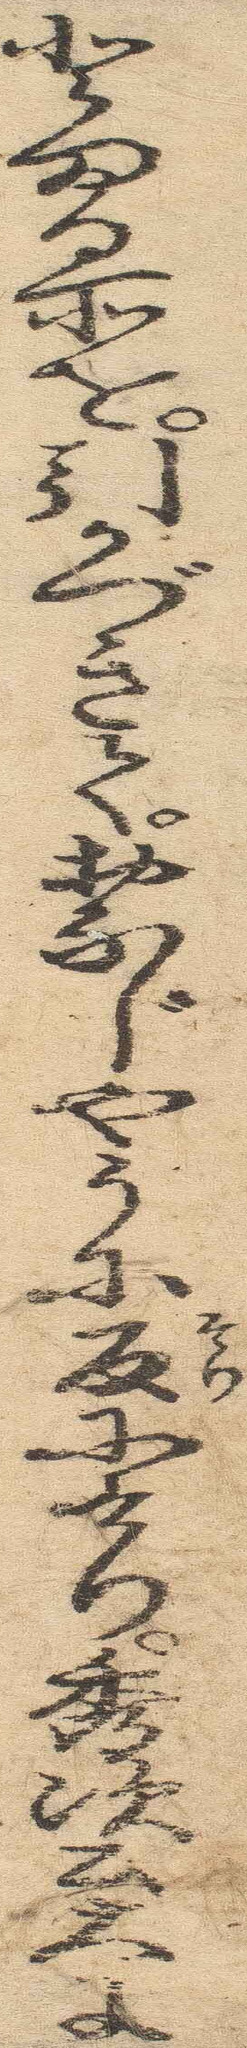とまる所を。引かづきて。おなじやうに反にけり。秀次公大に
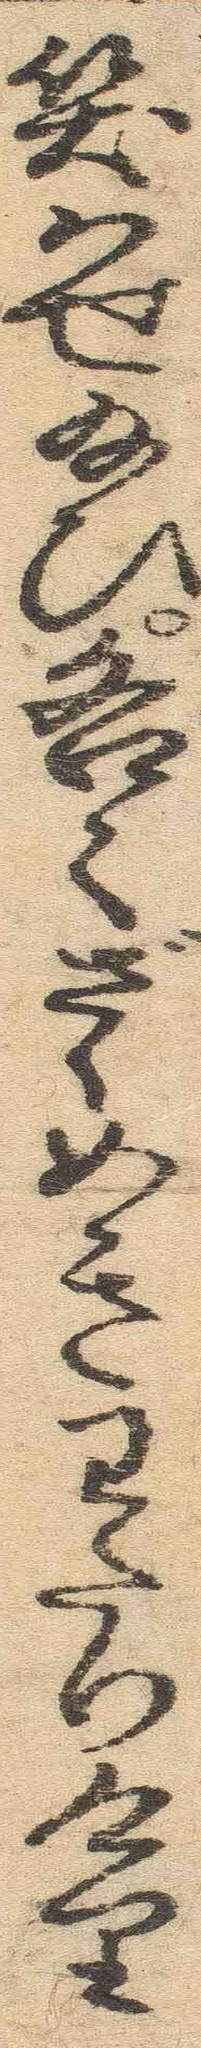笑はせ給ひ。各々ざゞめきわたりけり
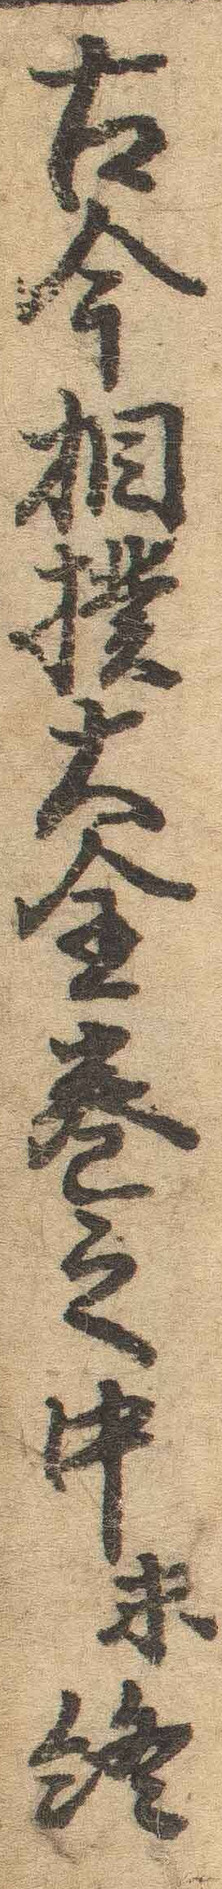古今相撲大全巻之中未終

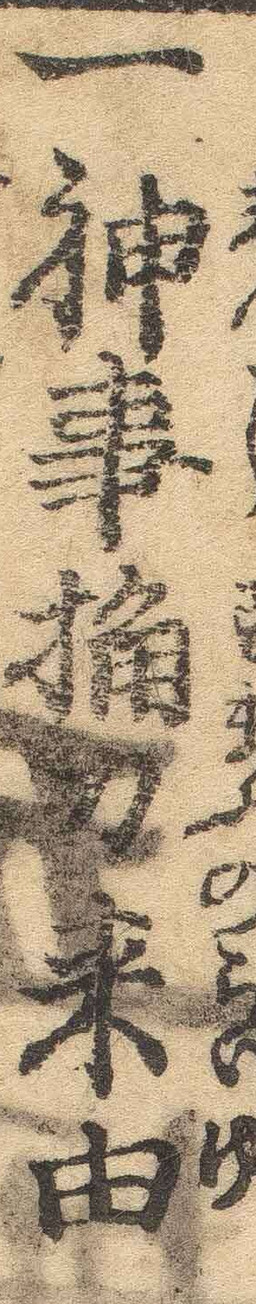一神事捔力来由
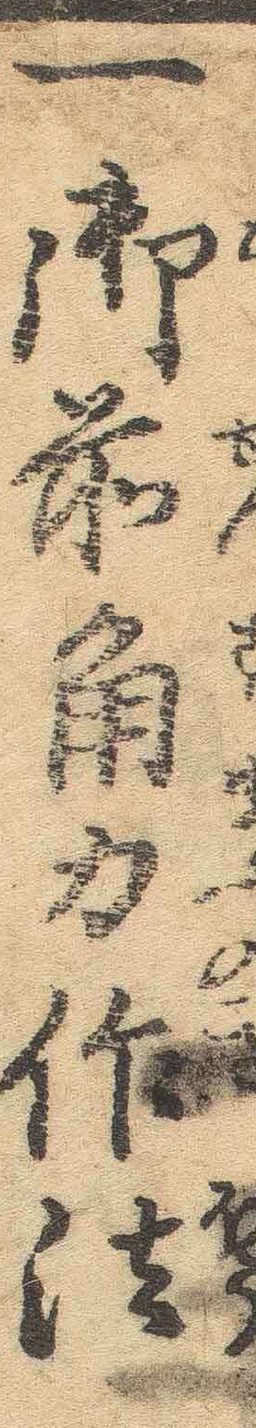一御前角力作法
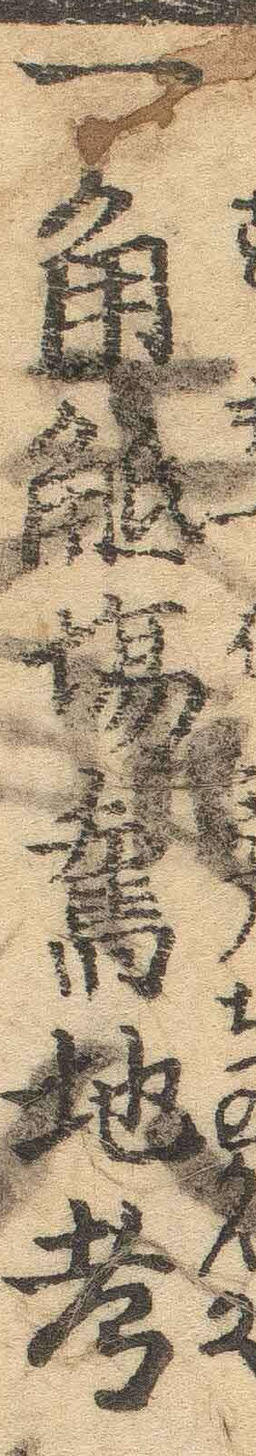一角觗場舊地考
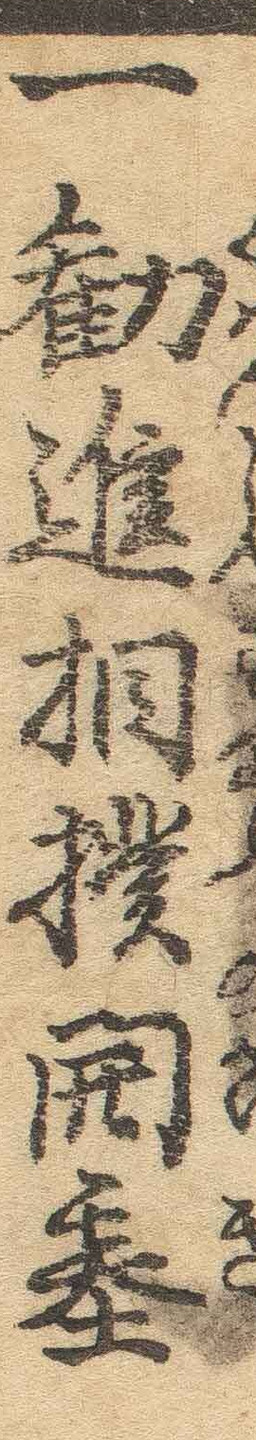一勧進相撲開基
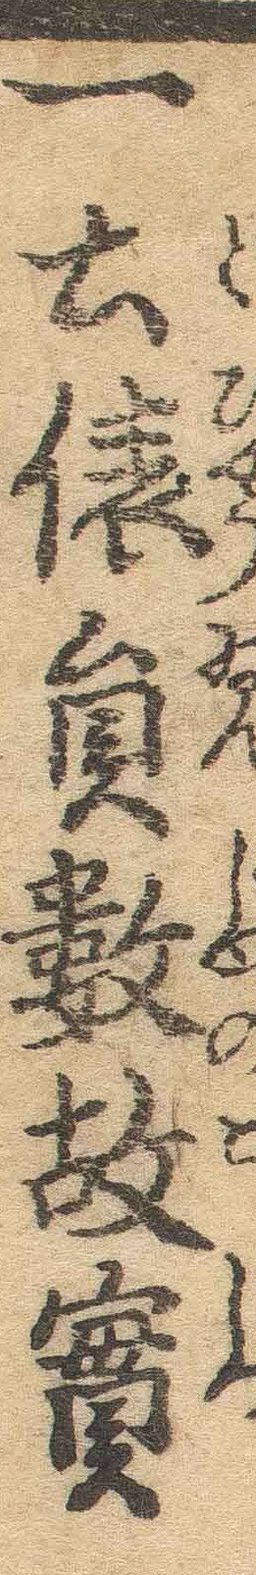一土俵員数故実
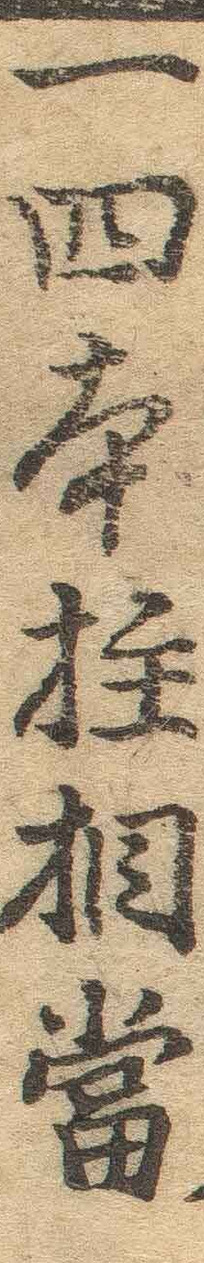一四本柱相当
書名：古今相撲大全
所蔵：東京学芸大学附属図書館 国文学研究資料館
